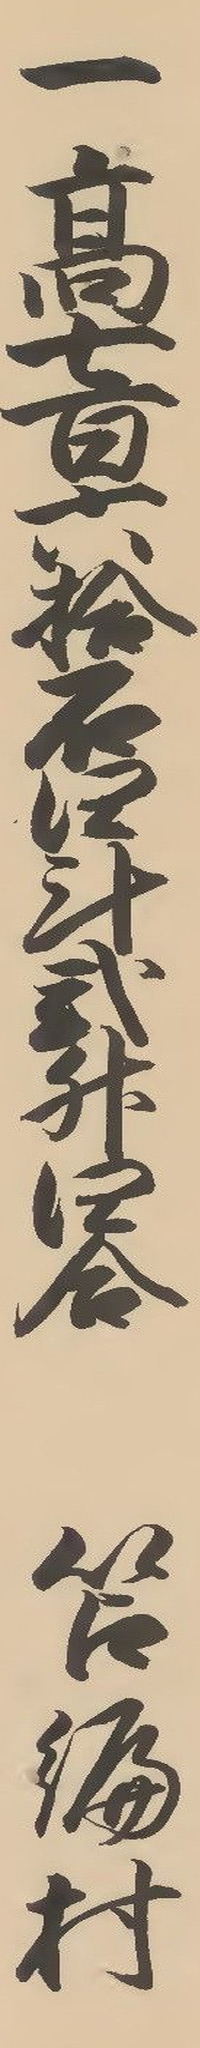一髙七百六拾石四斗弐升四合苫編村
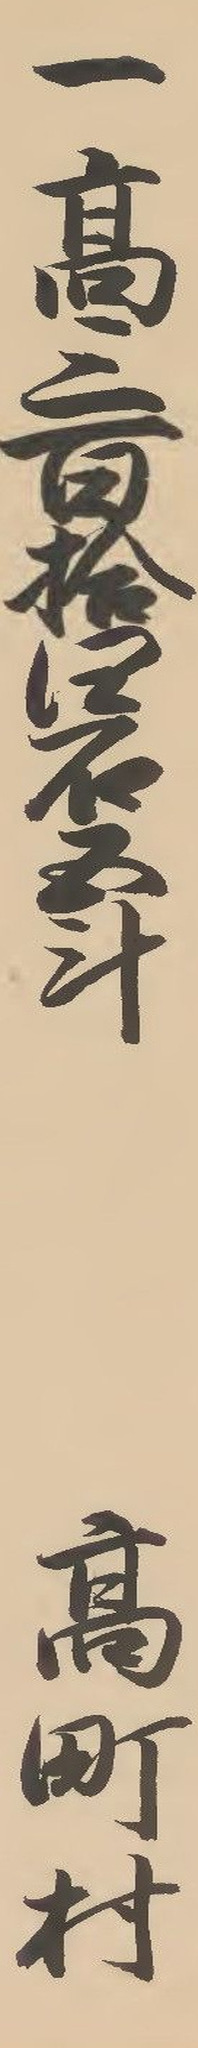一髙三百拾四石五斗髙町村
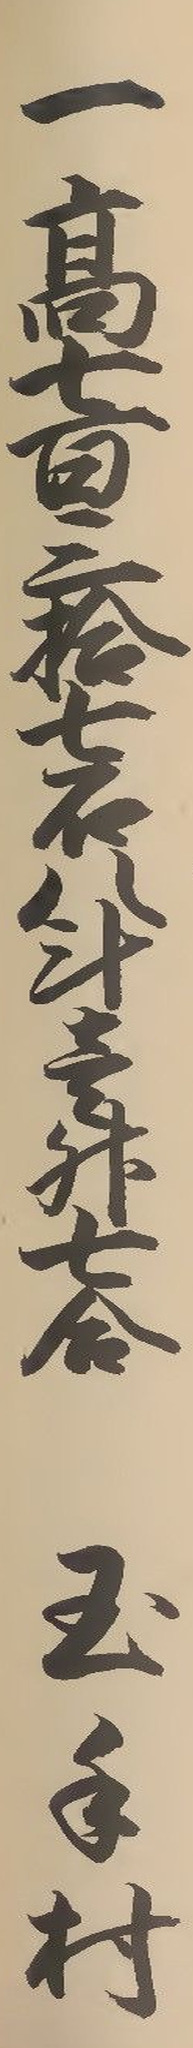一髙七百三拾七石八斗壱升七合玉手村
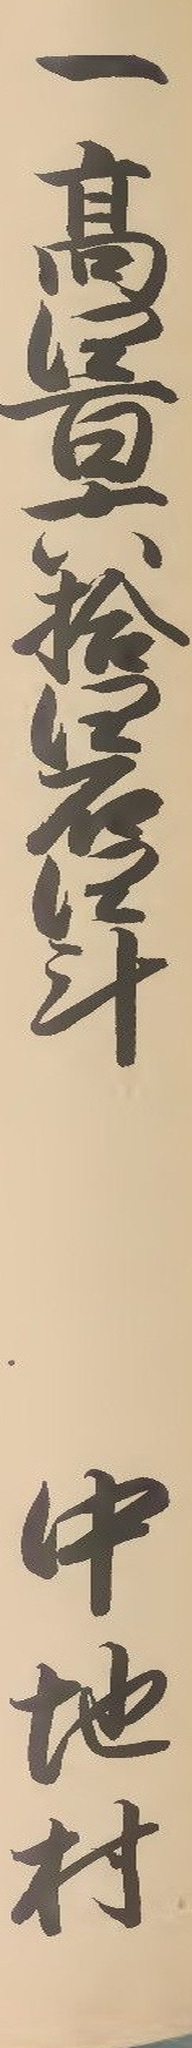一髙四百六拾四石四斗中地村
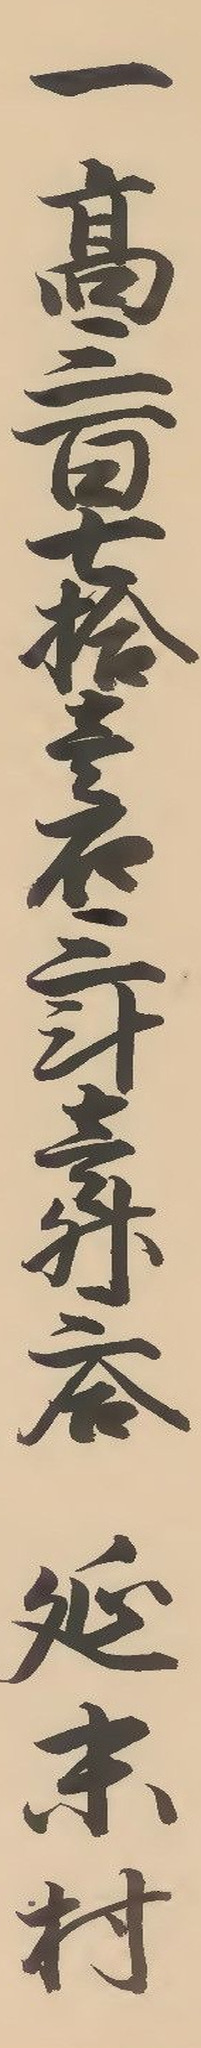一髙三百七拾壱石三斗壱升三合延末村
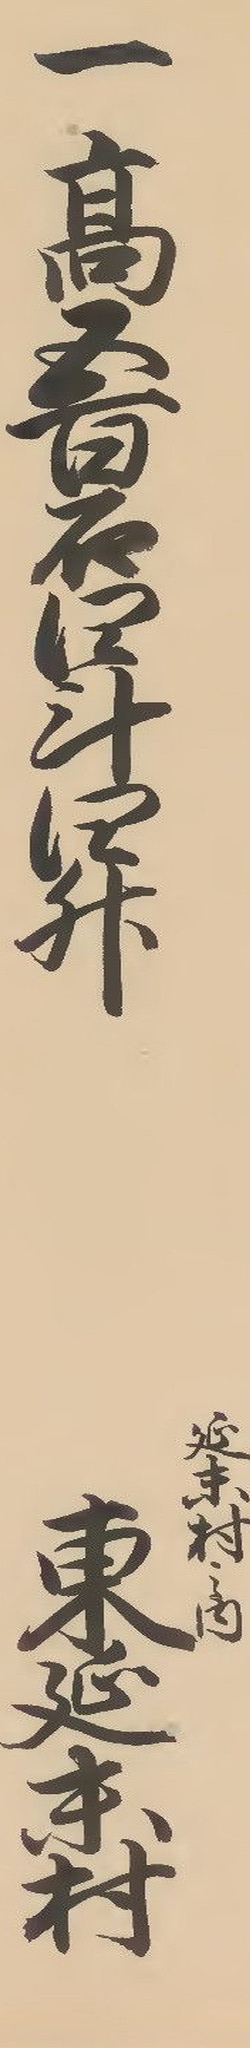一髙五百石四斗四升東延末村
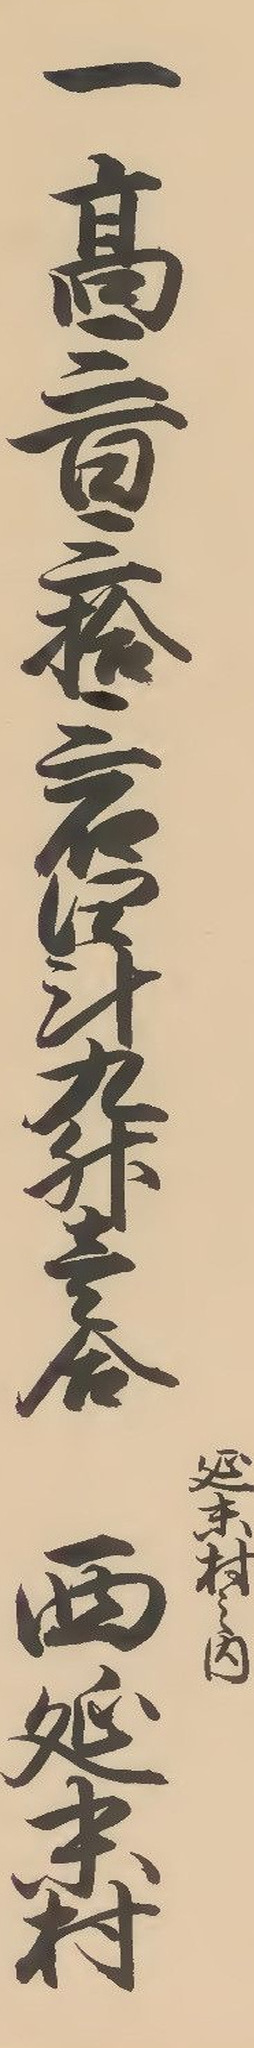一髙三百三拾三石四斗九升壱合西延末村

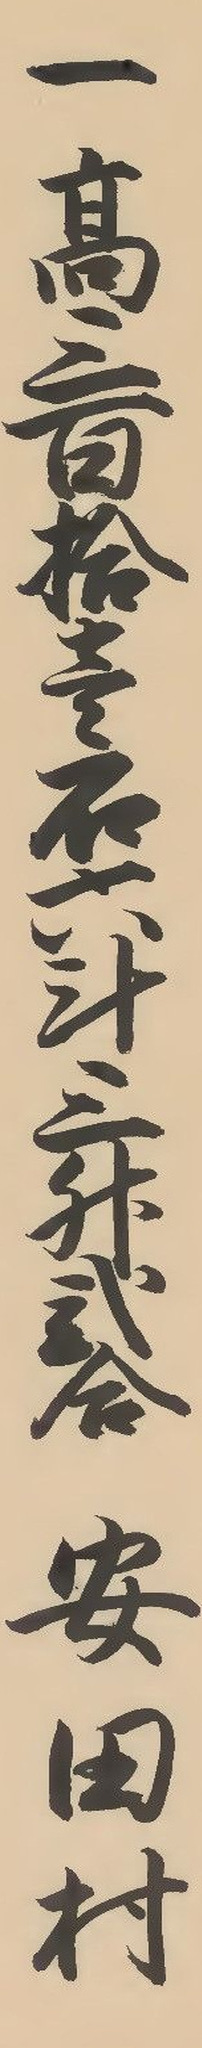一髙三百拾壱石六斗三升弐合安田村
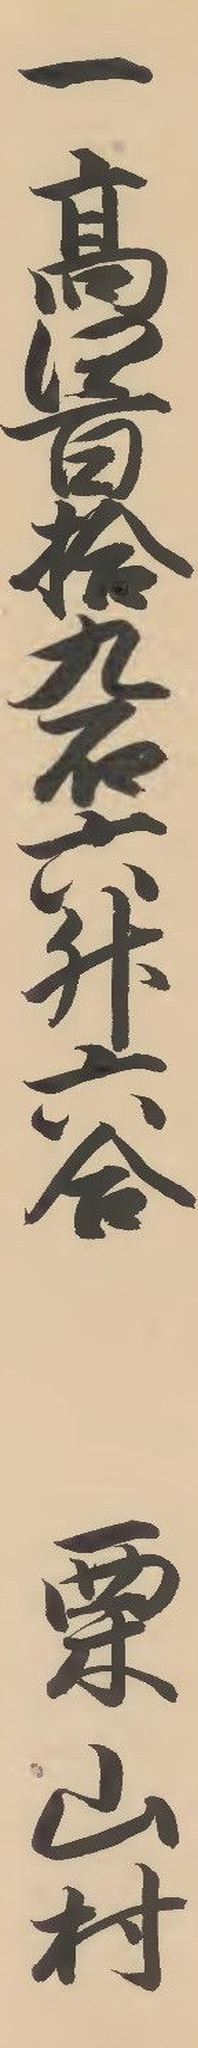一髙四百拾九石六升六合栗山村
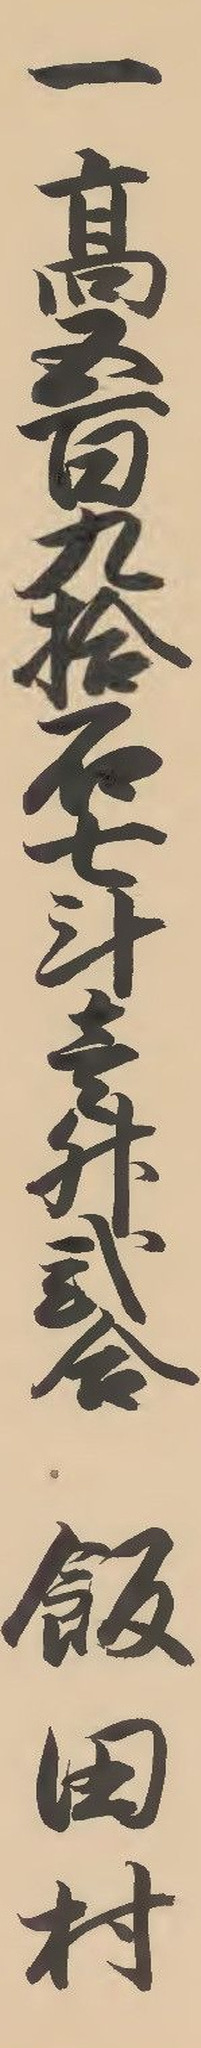一髙五百九拾石七斗壱升弐合飯田村
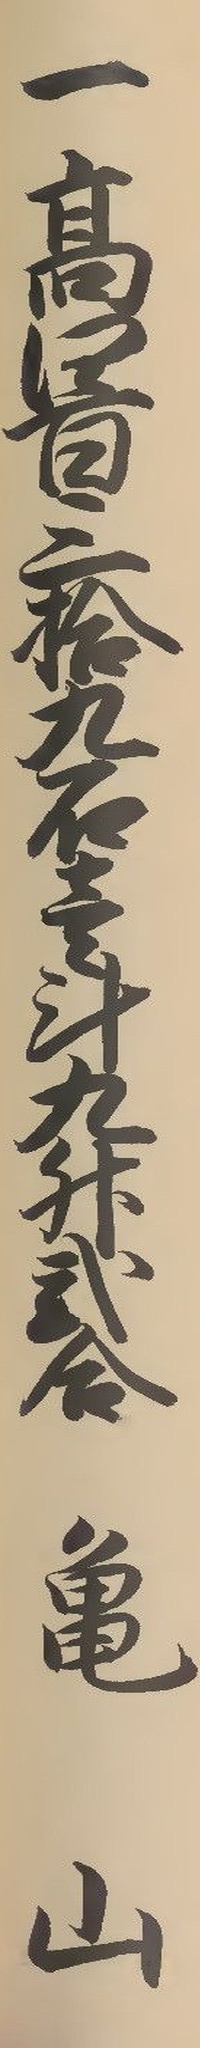一髙四百三拾九石壱斗九升弐合亀山
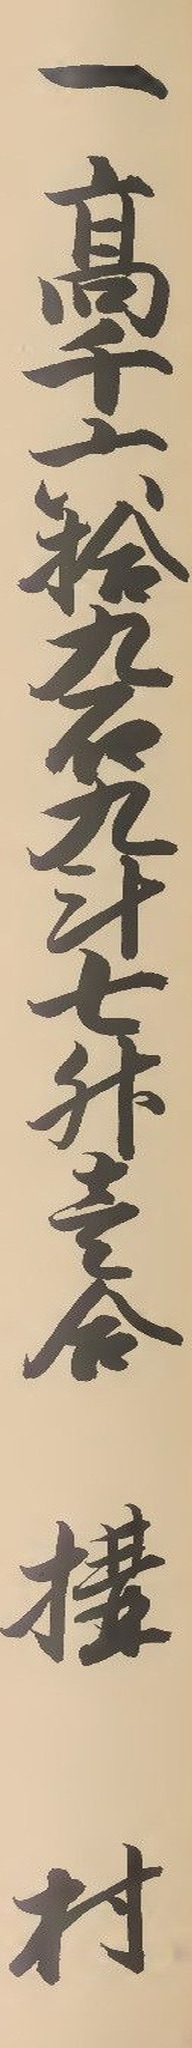一髙千六拾九石九斗七升壱合構村
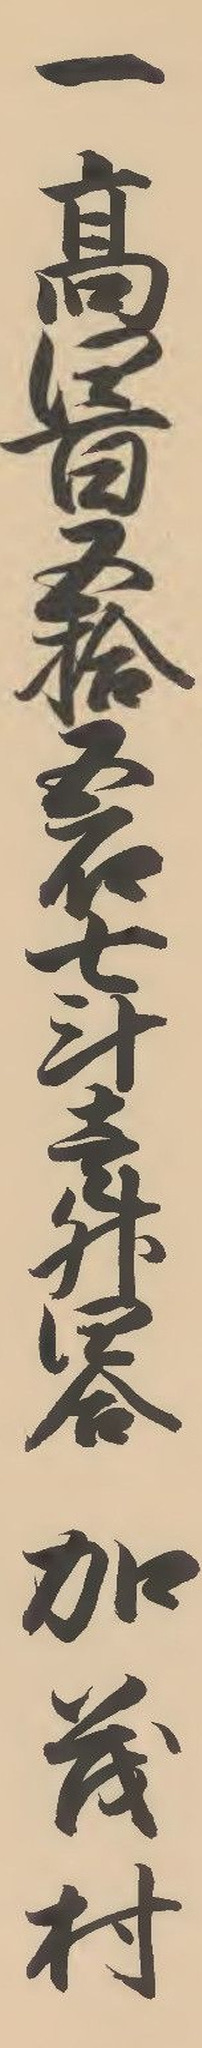一髙四百五拾五石七斗壱升四合加茂村
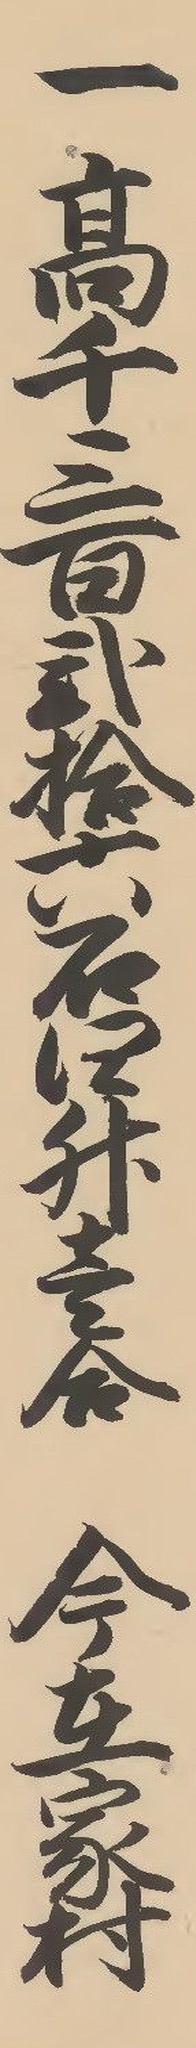一髙千三百弐拾六石四升壱合今在家村
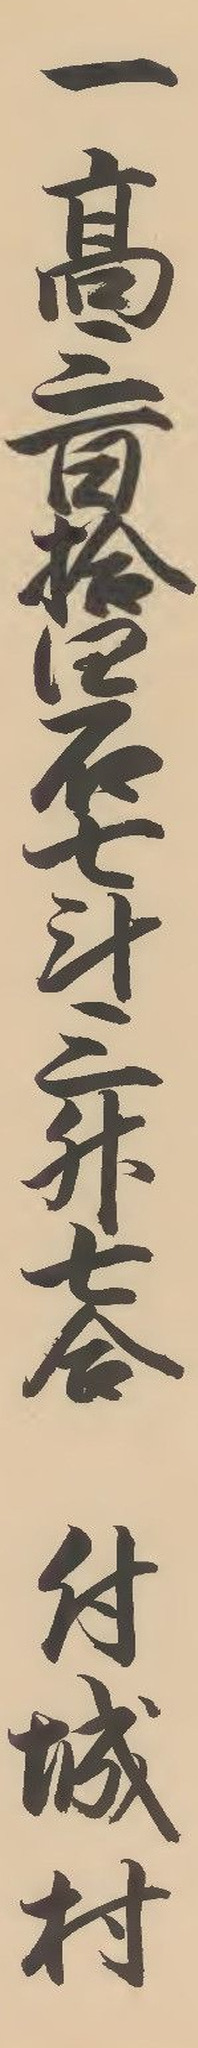一髙三百拾四石七斗三升七合付城村

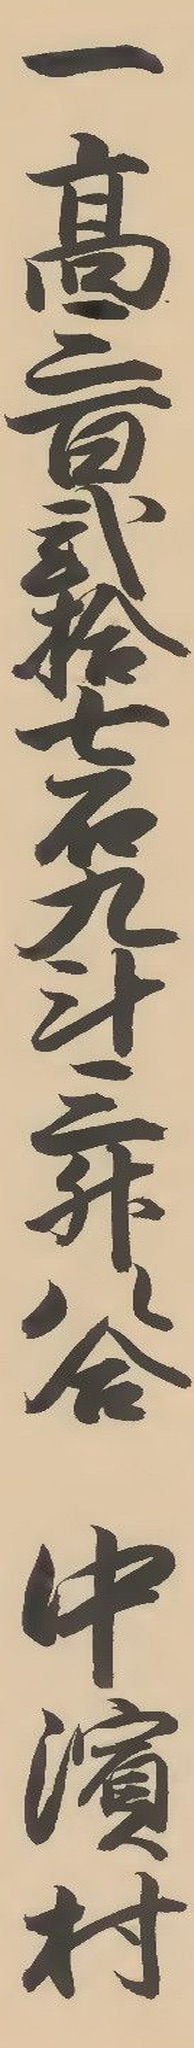一髙三百弐拾七石九斗三升八合中濱村
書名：播磨国郷帳
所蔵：国立公文書館 National Archives of Japan
